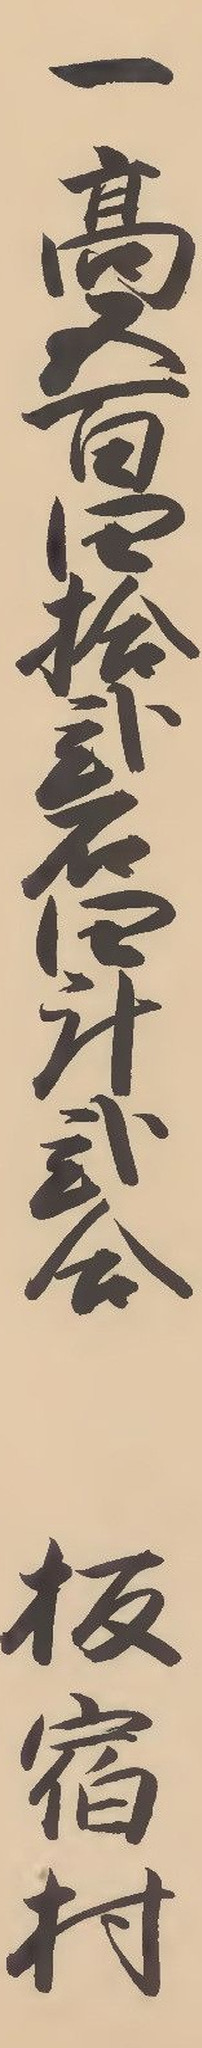一高五百四拾弐石四斗弐合板宿村
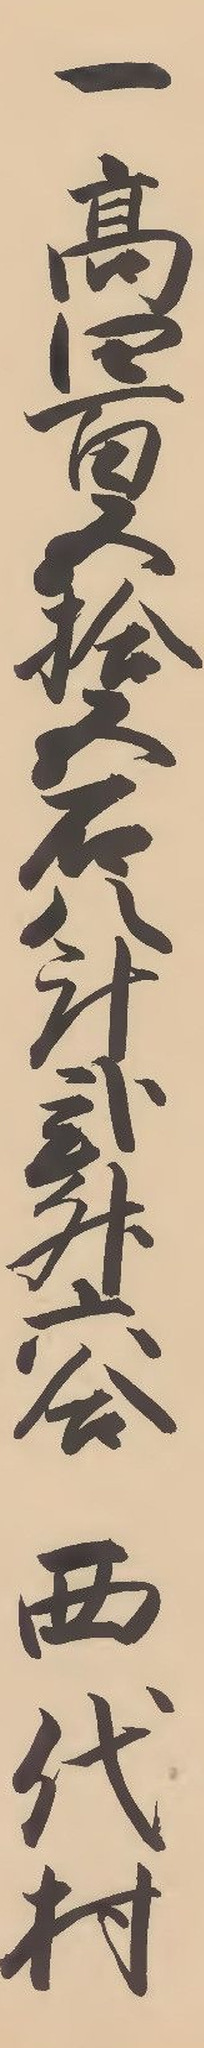一高四百五拾五石八斗弐升六合西代村
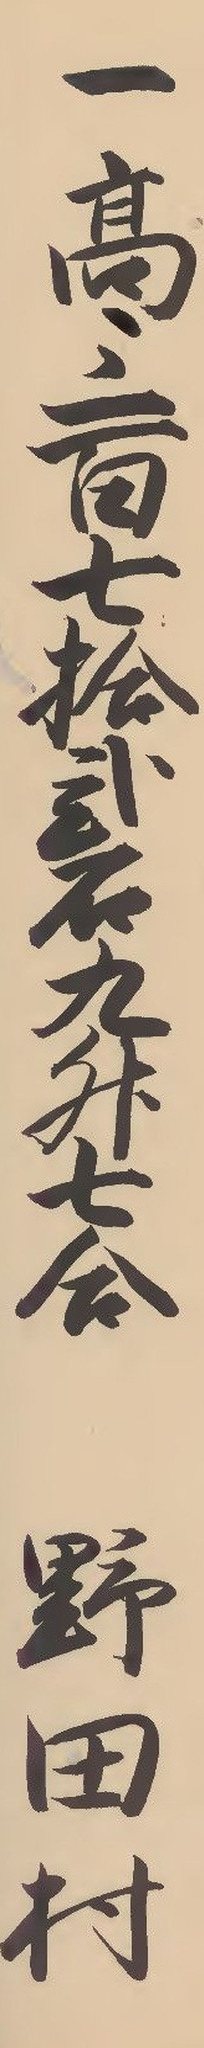一高三百七拾弐石九升七合野田村
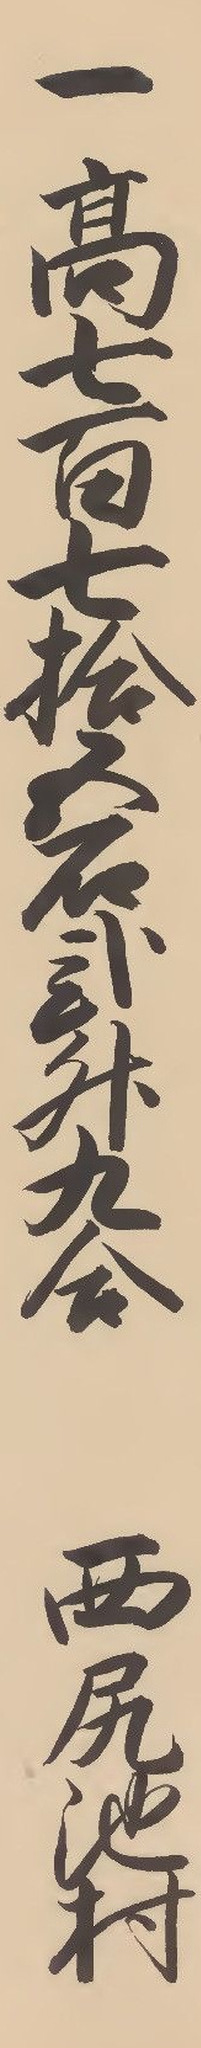一高七百七拾五石弐升九合西尻池村
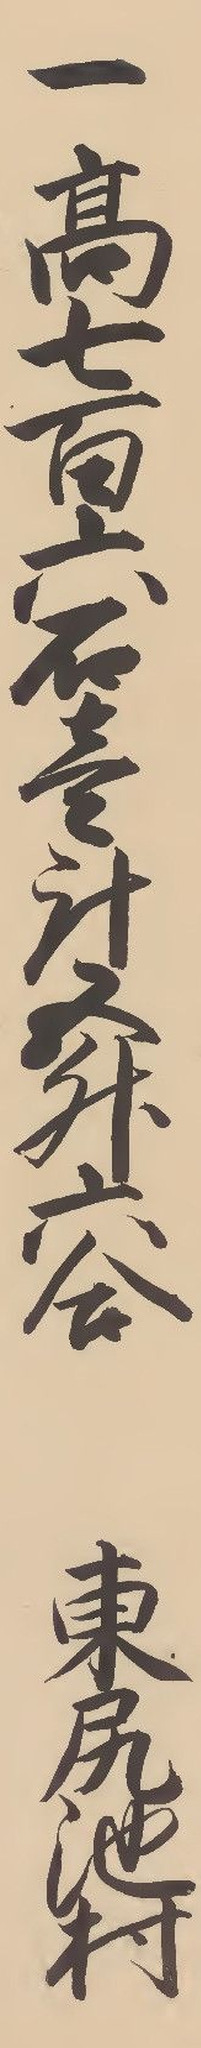一高七百六石壱斗五升六合東尻池村
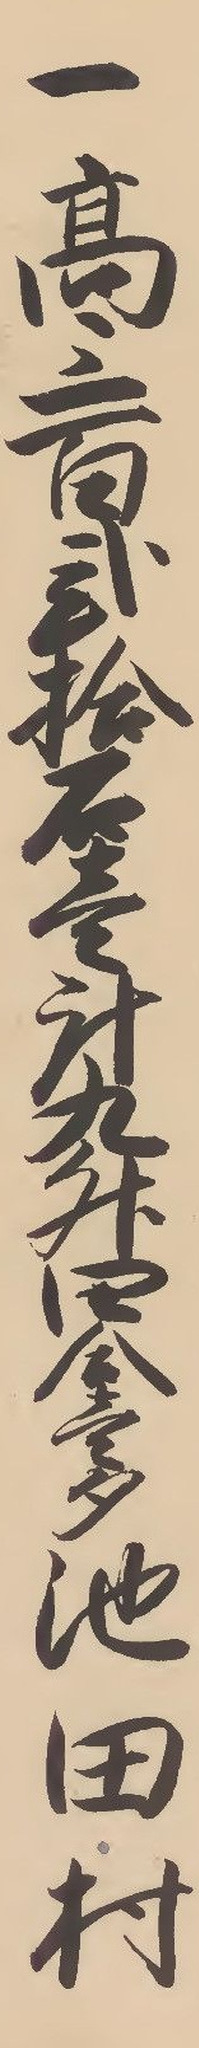一高三百弐拾石壱斗九升四合壱勺池田村

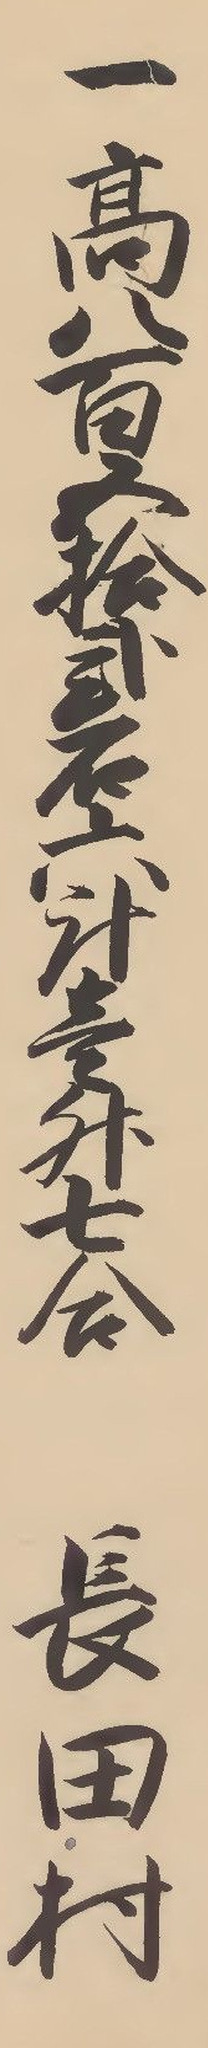一高八百五拾弍石六斗壱升七合長田村
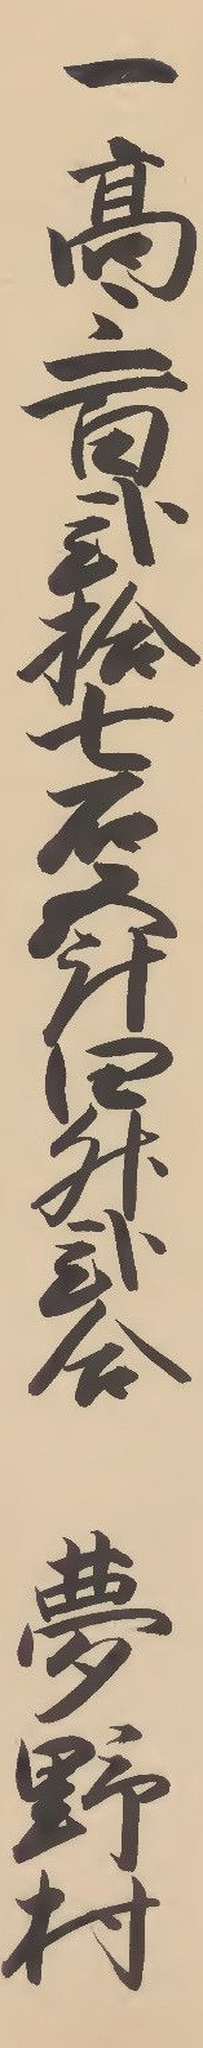一高三百弐拾七石五斗四升弐合夢野村
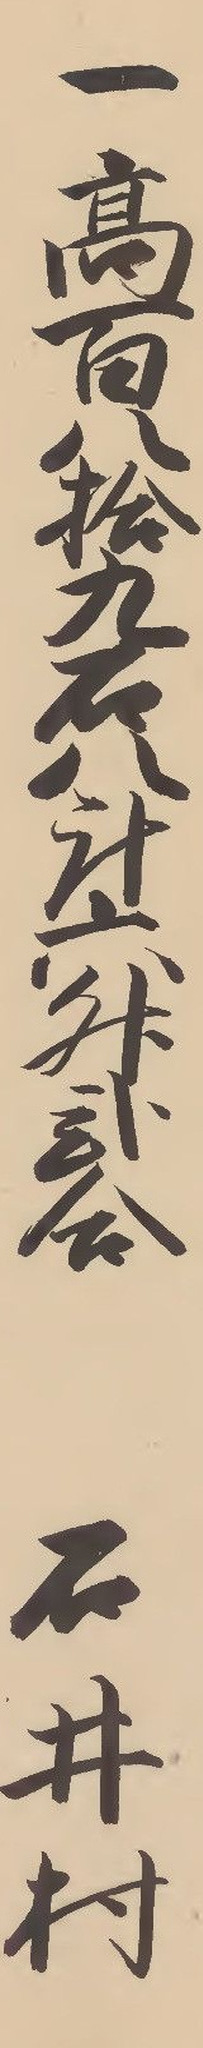一高百八拾九石八斗六升弐合石井村
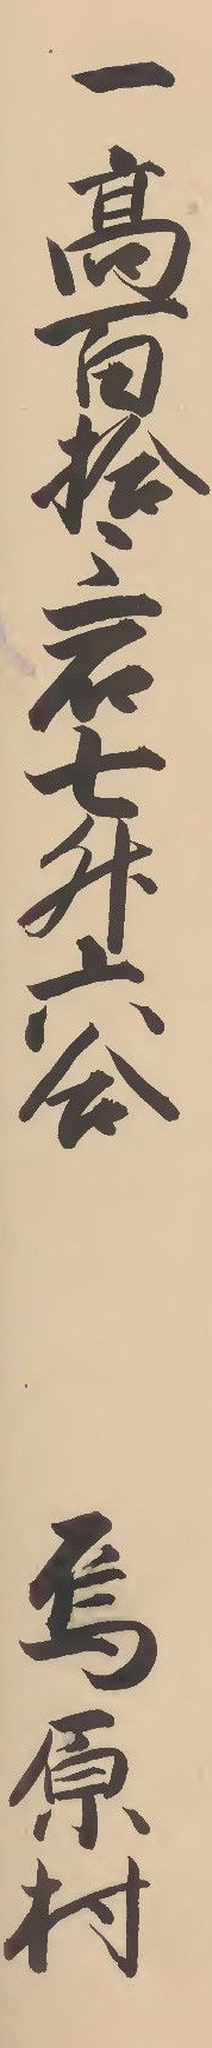一高百拾三石七升六合烏原村
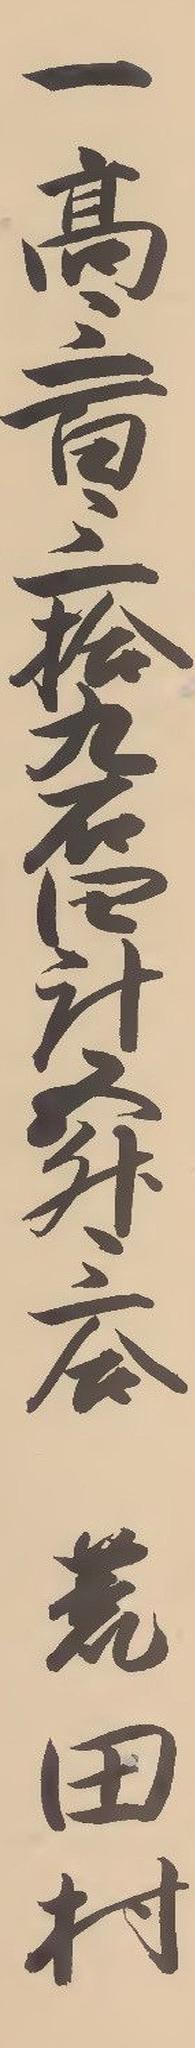一高三百三拾九石四斗五升三合荒田村
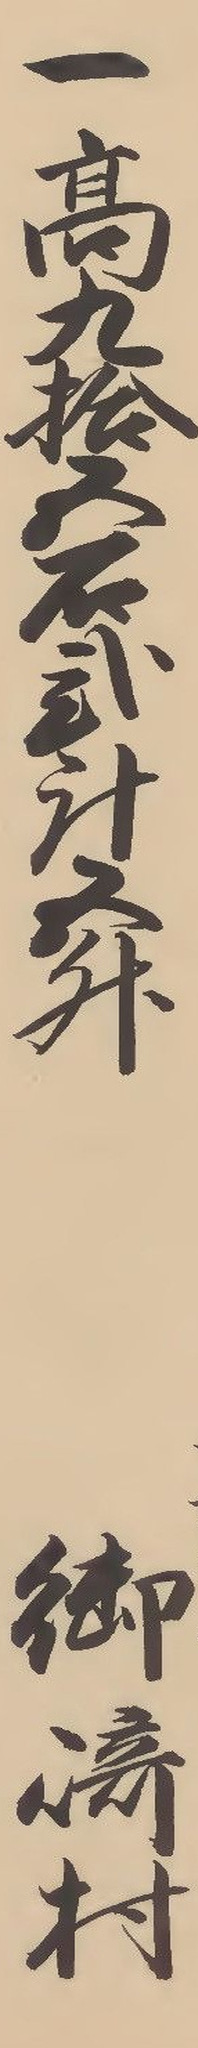一高九拾五石弐斗五升御崎村
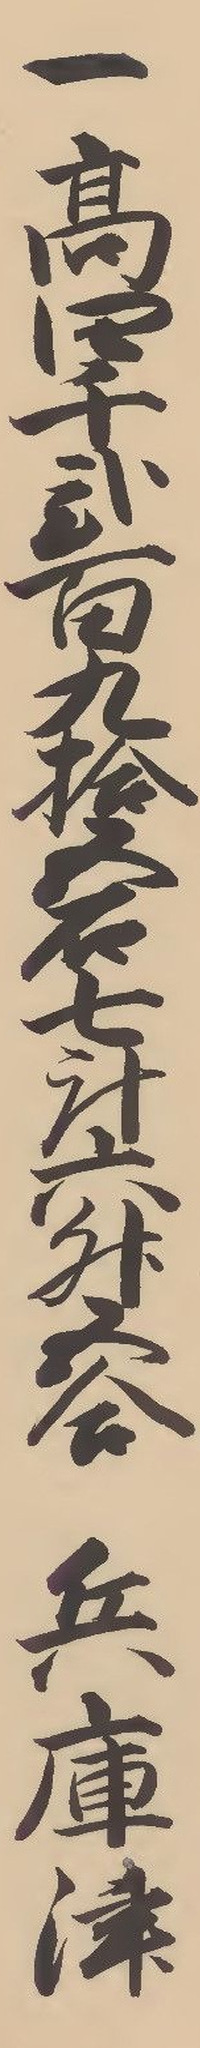一高四千弐百九拾五石七斗六升五合兵庫津

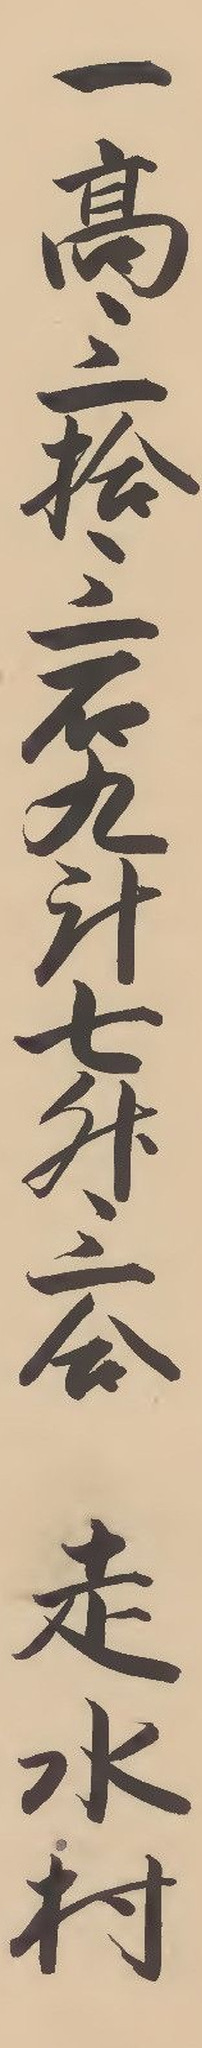一高三拾三石九斗七升三合走水村
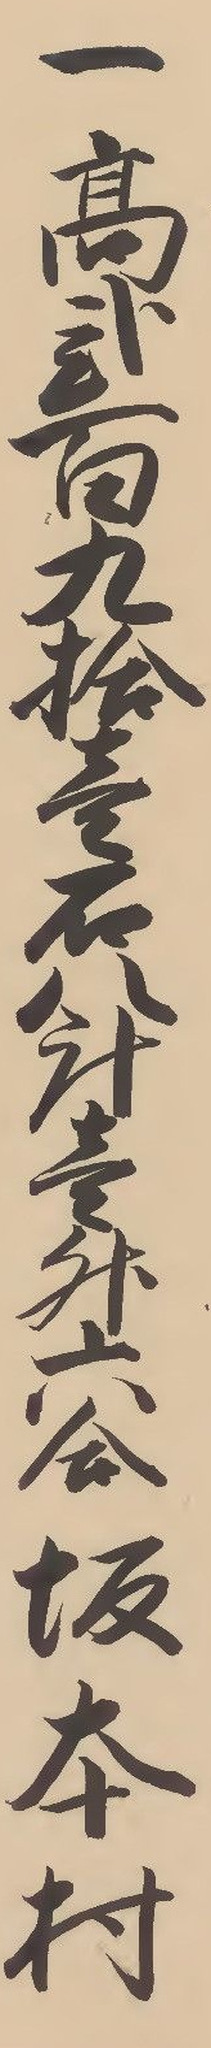一高弍百九拾壱石八斗壱升六合坂本村
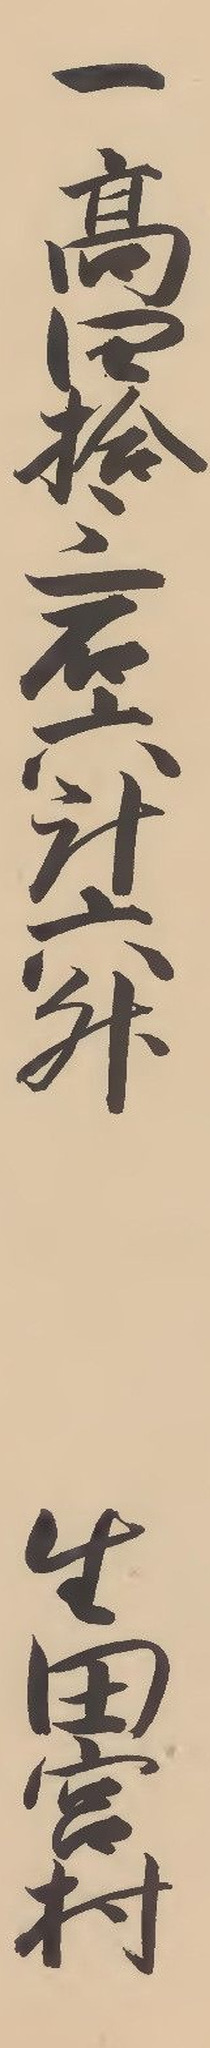一高四拾三石六斗六升生田宮村
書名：摂津国郷帳
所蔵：国立公文書館 National Archives of Japan
